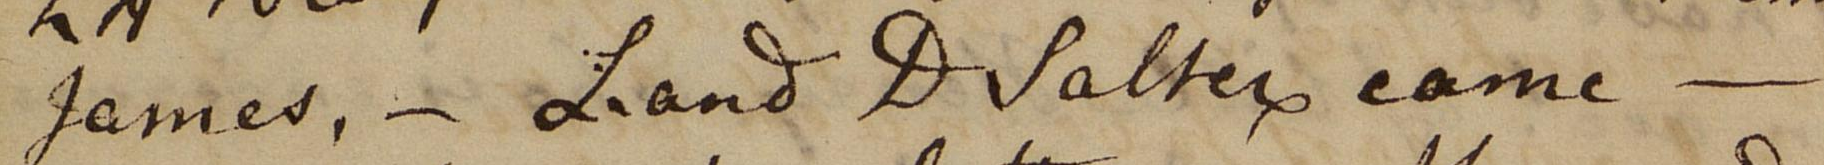James,- L. and D Salter came-
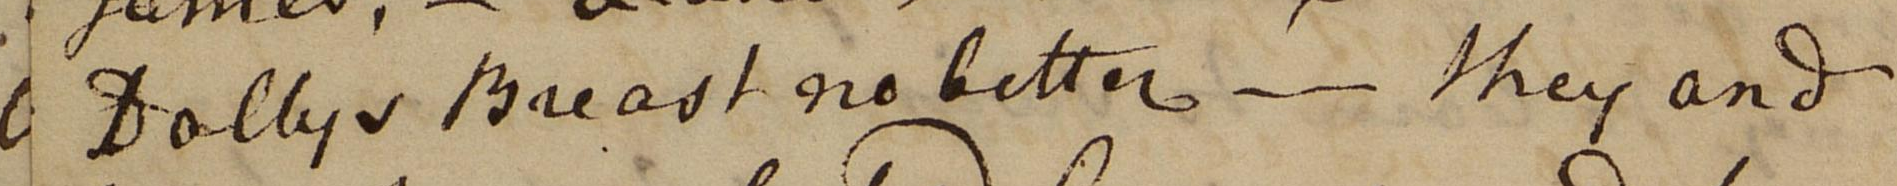Dollys Breast no better- they and
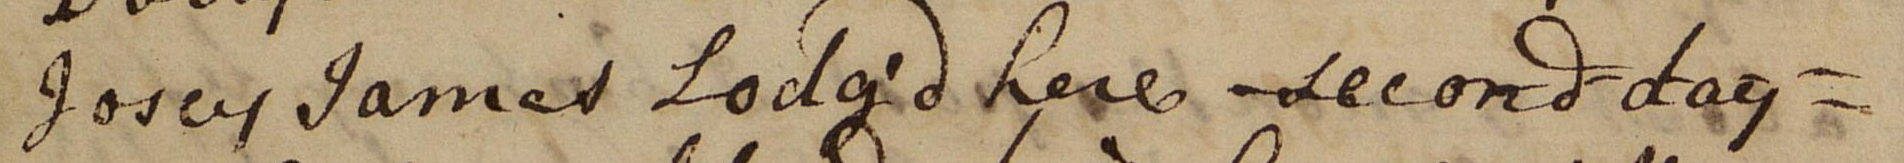Josey James Lodg'd here- second day-
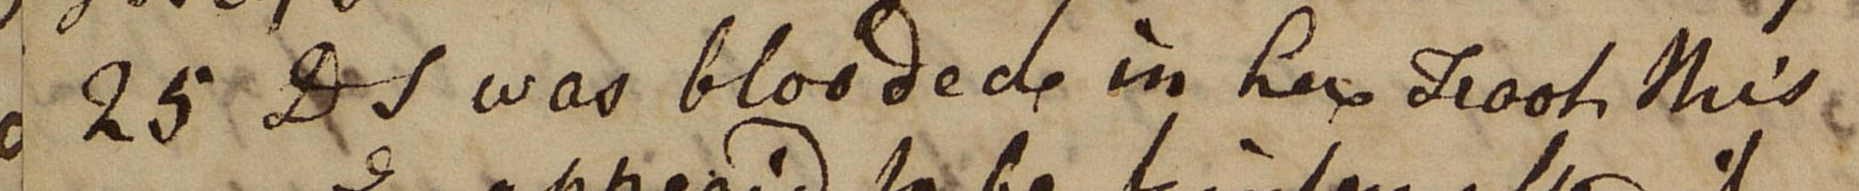25 D S was blooded in her Troot this
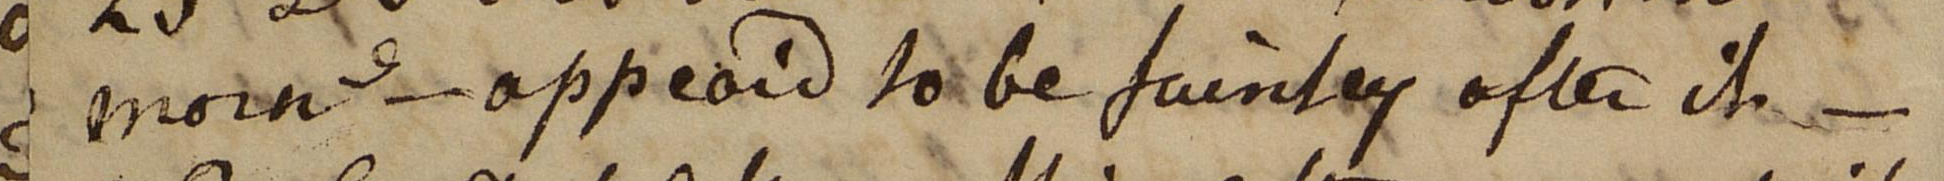morn^g- appear'd to be faintly after it-
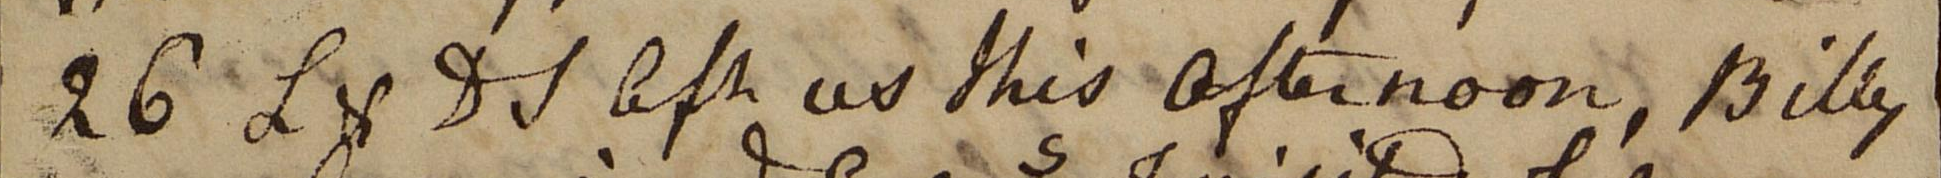26 L & D S left us this Afternoon, Billy
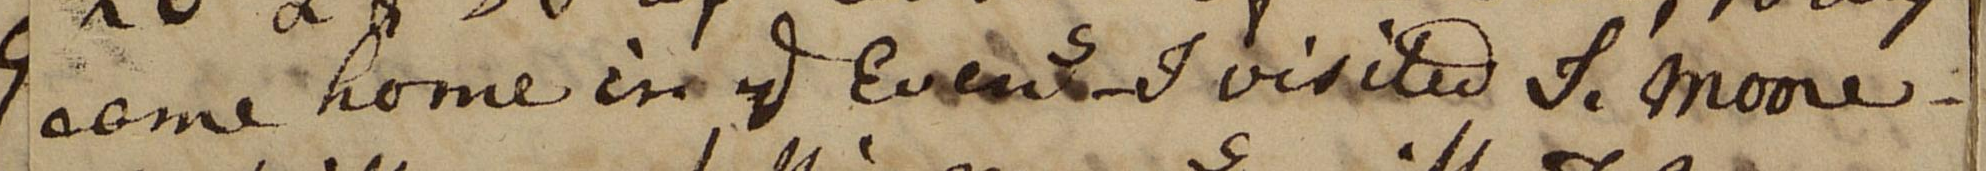came home in y^e Even^g- I visited S. Moore-
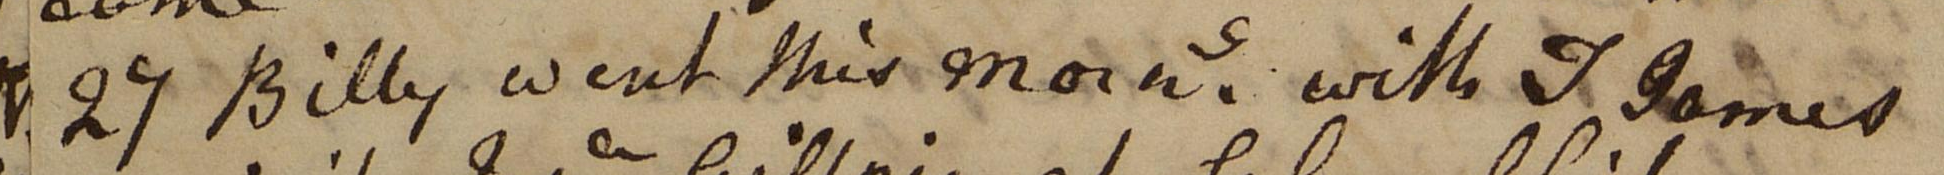27 Billy went this morn^g.- with T James
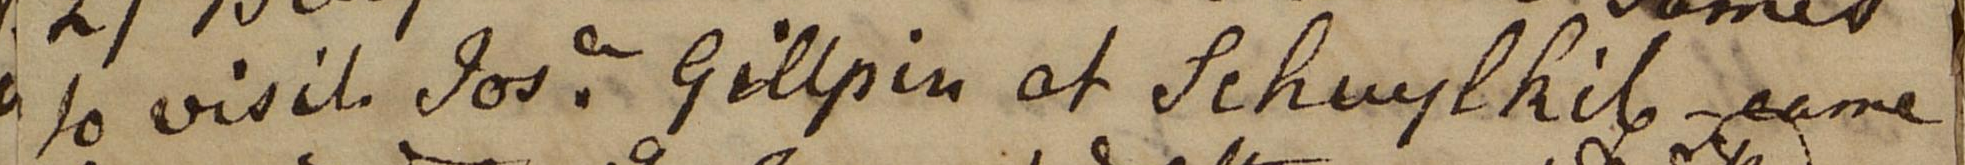to visit Jos.^a Gillpin at Schuylkil -came
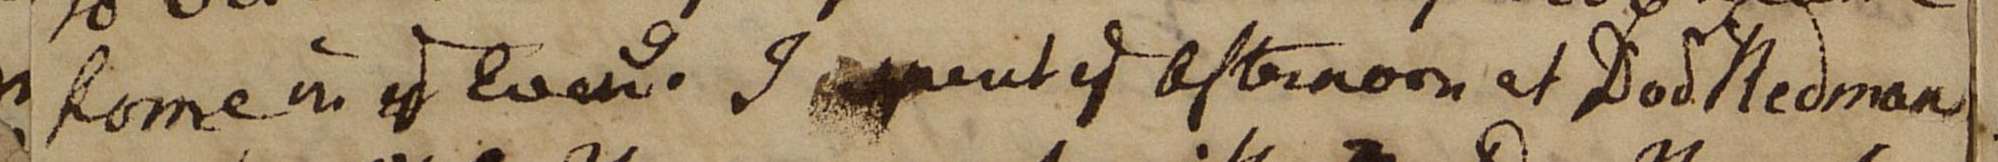home in y^e Even^g. I spent y^e afternoon at Doc^r. Redman
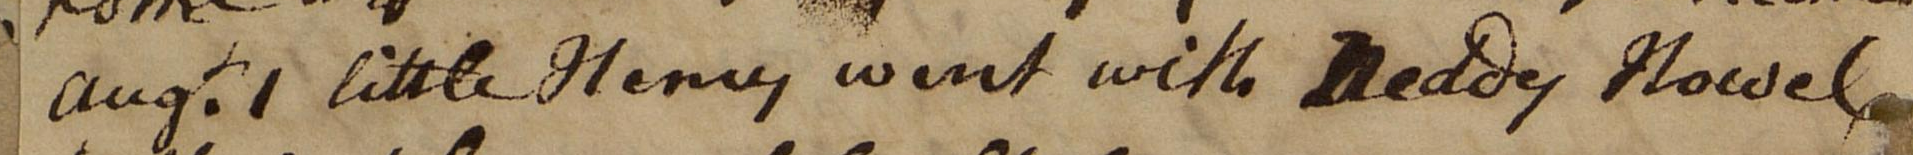Aug^t. 1 little Henry went with Neddy Howel
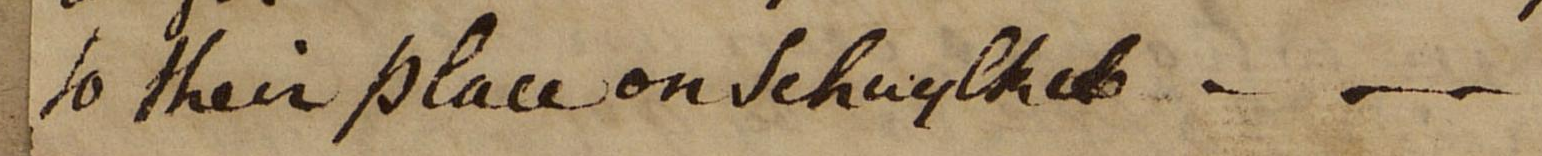to their place on Schuykil--
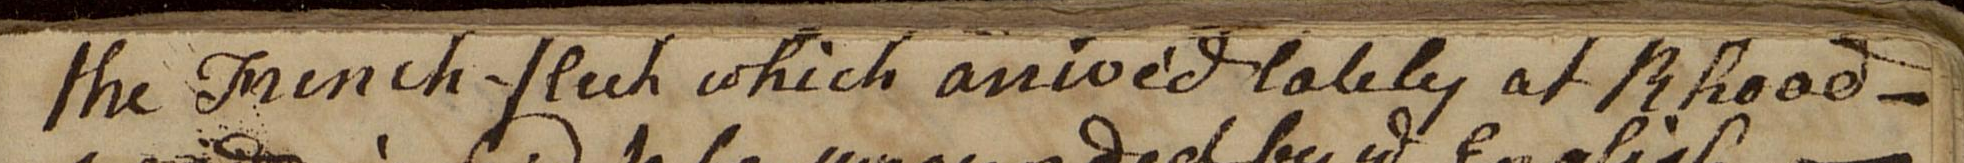the French fleet which arrived lately at Rhoad-
